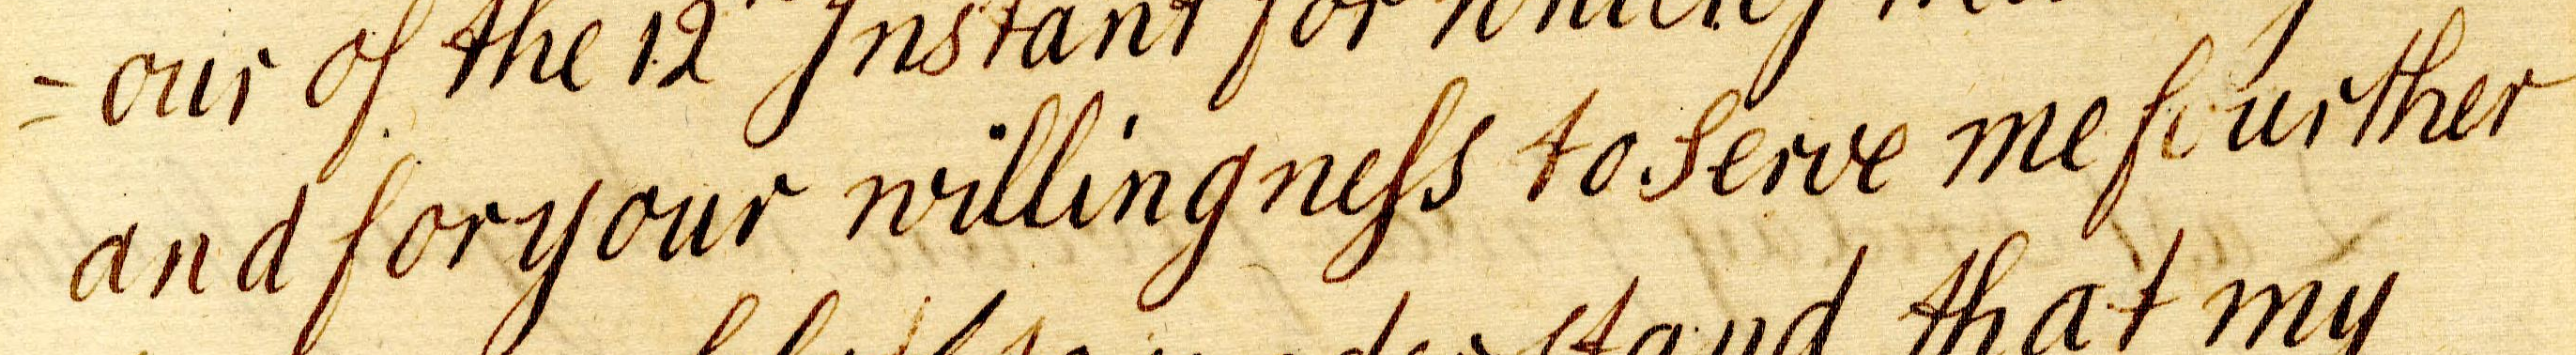and for your willingness to Serve me fourther
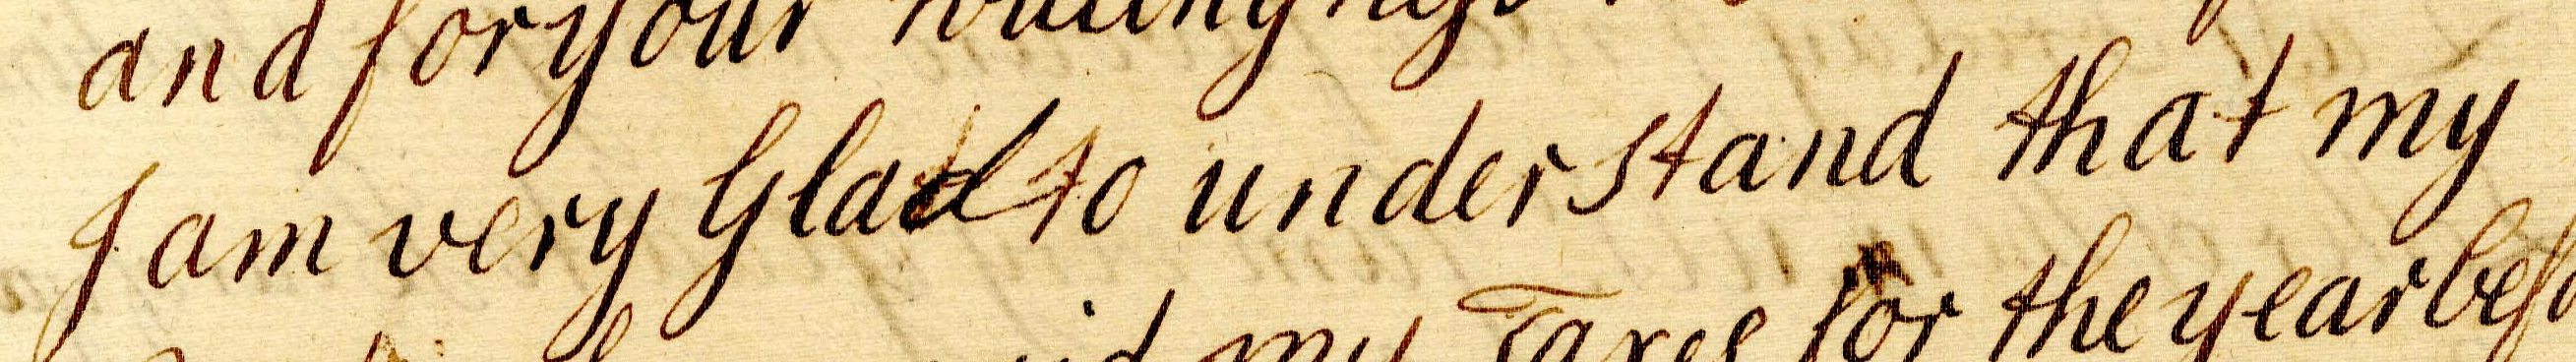I am very Glad to understand that my
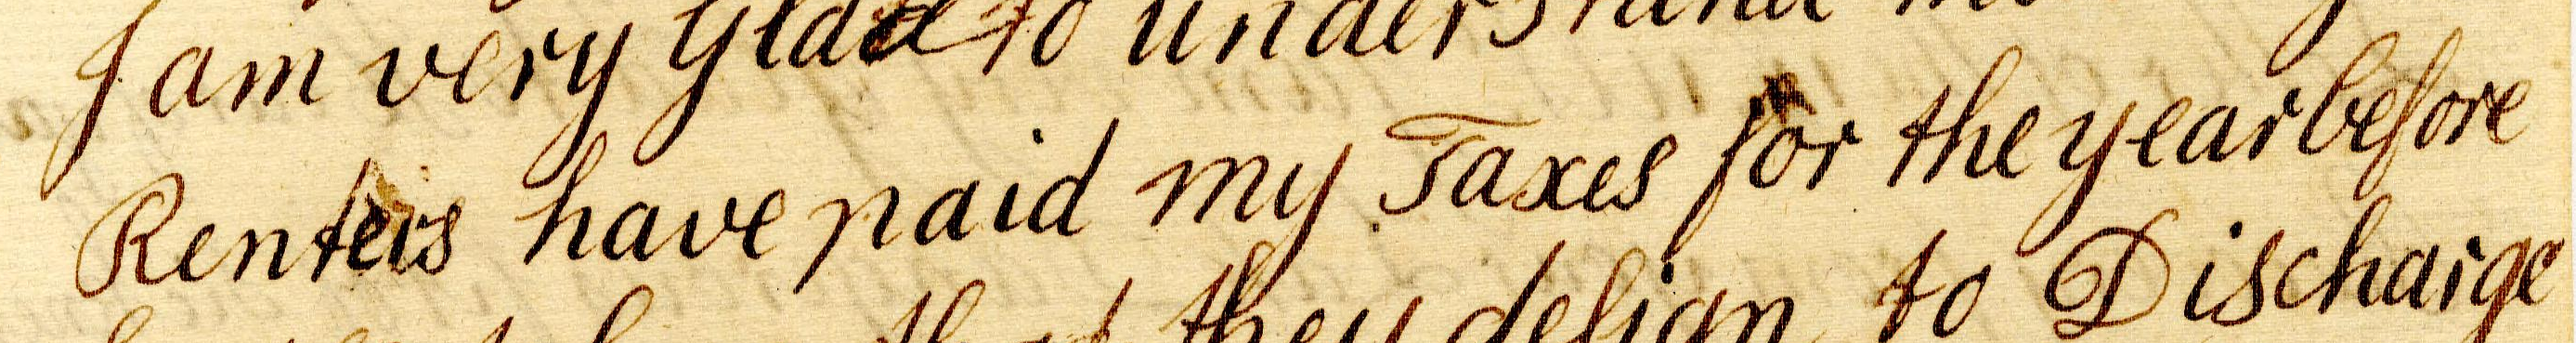Renters have paid my Taxes for the year before
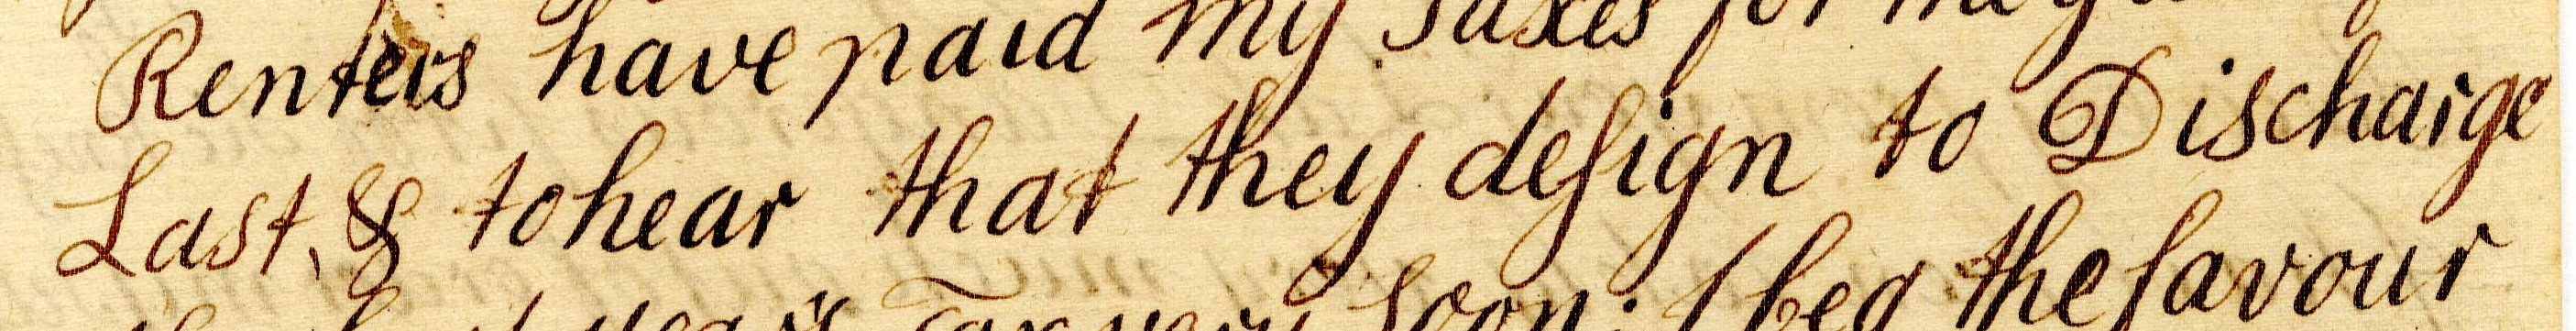Last, & to hear that they design to Discharge
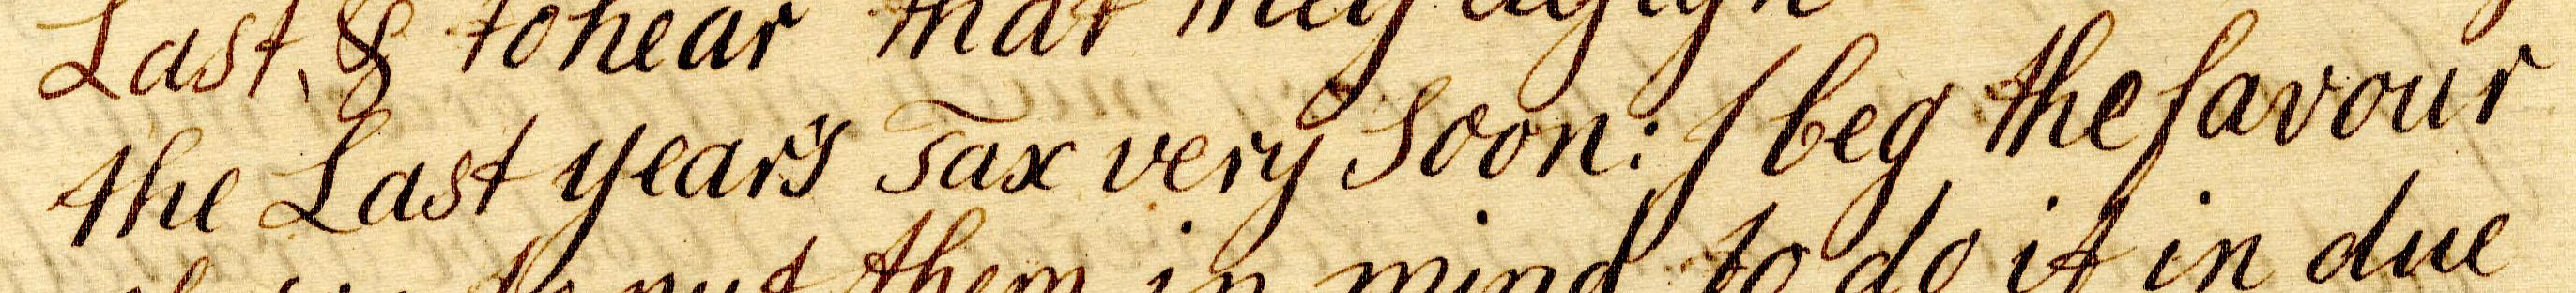the Last Years Tax very Soon: I beg the favour
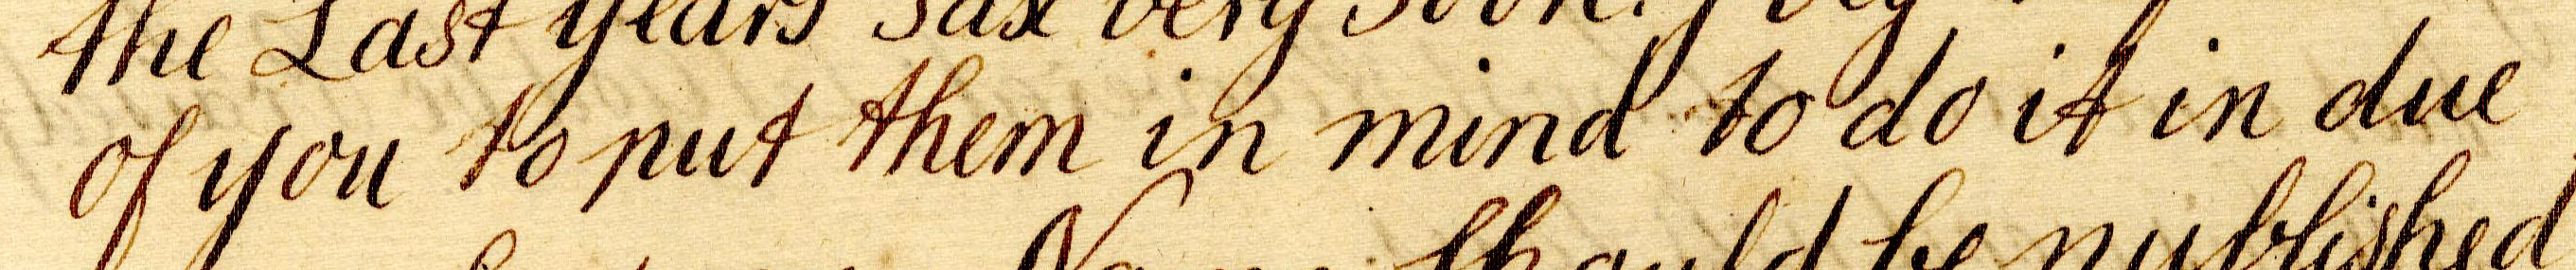of you to put them in mind to do it in due
